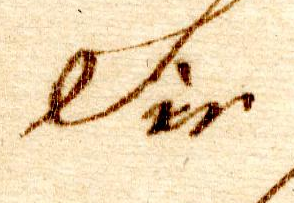Sir
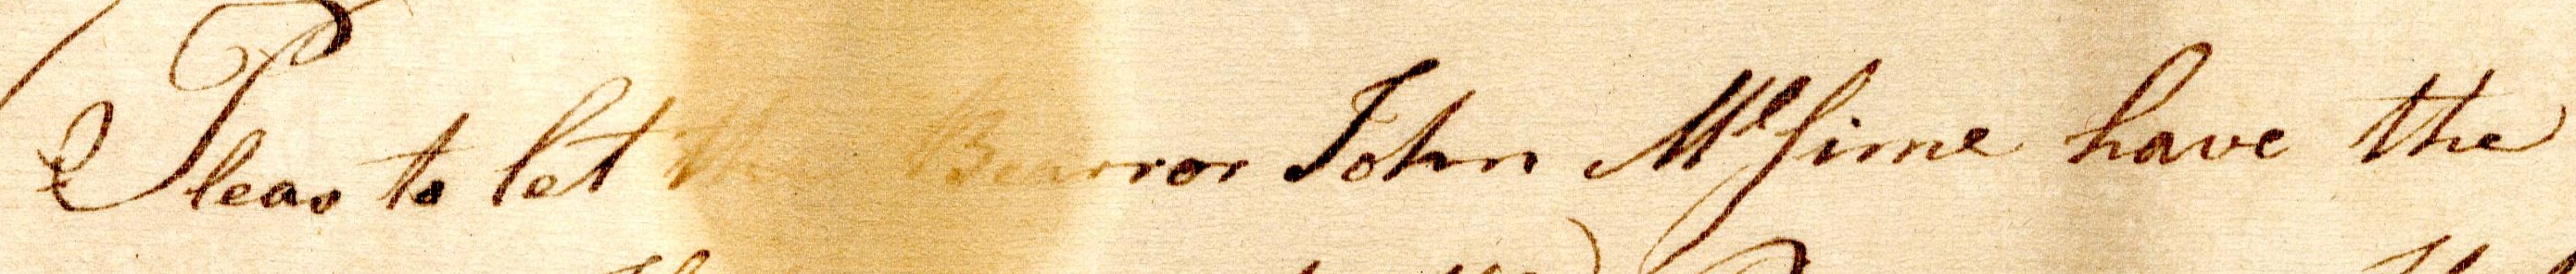Pleas to let the Bearror John M^c.Sime have the
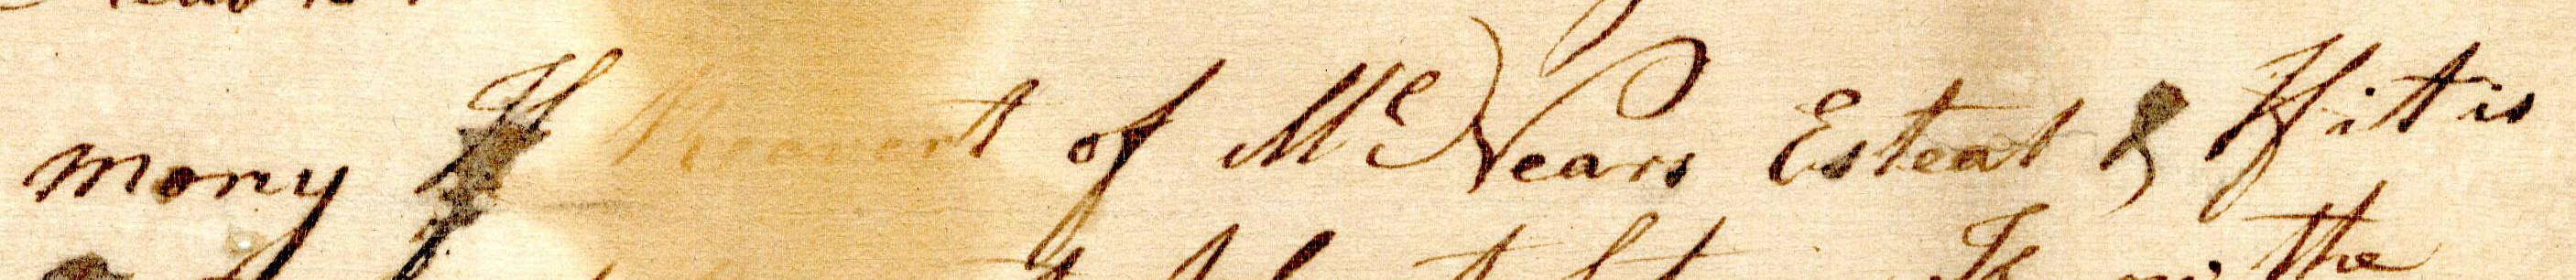mony I Recovert of M^r. Nears Esteat & if it is
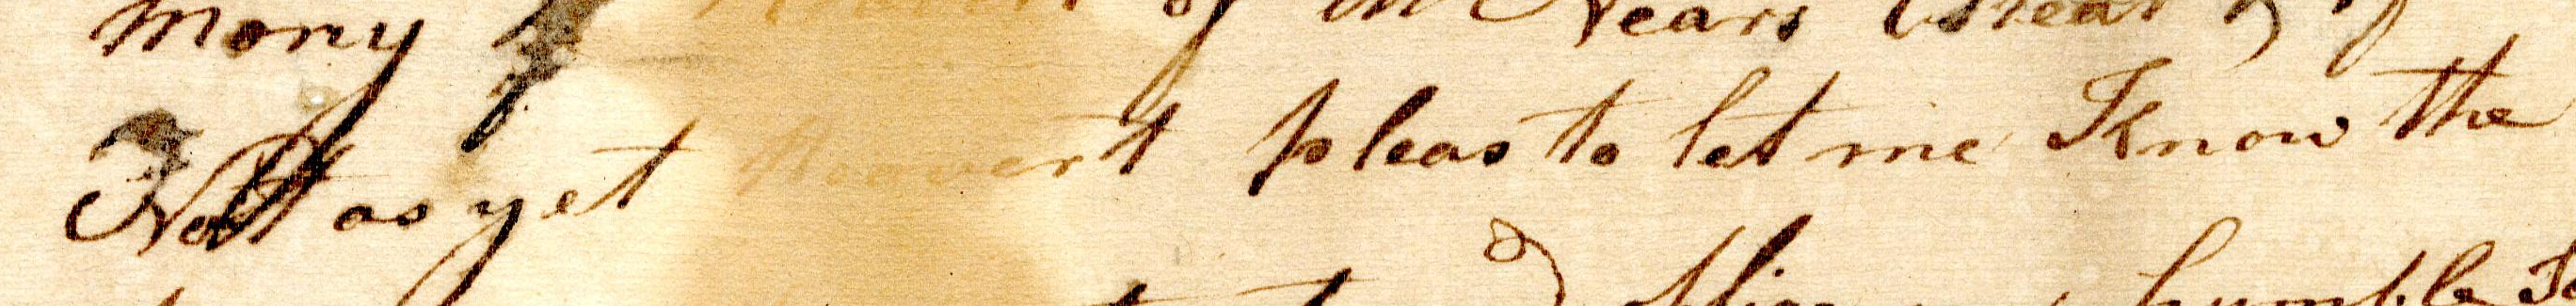Nott as yet Recovert pleas to let me Know the
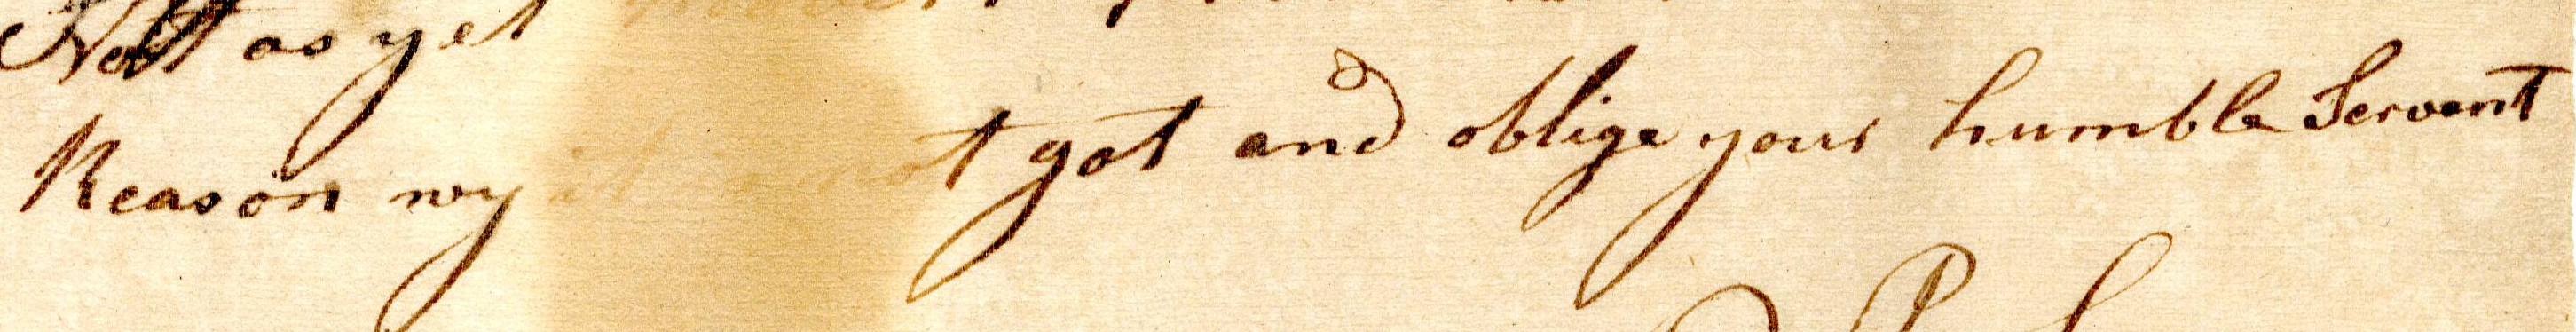Reason wy it is not yot and oblige your humble Servent
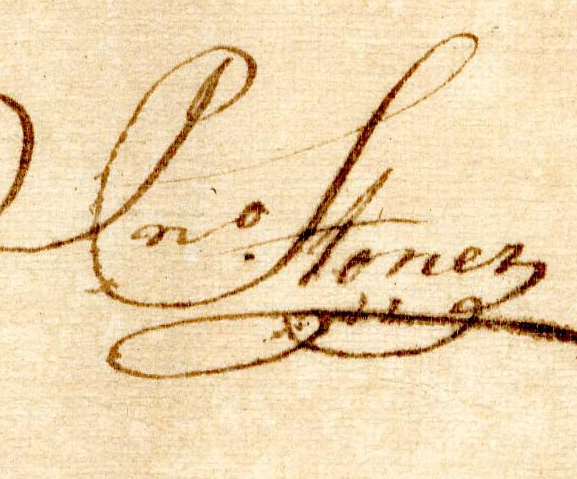Jn^o Stoner
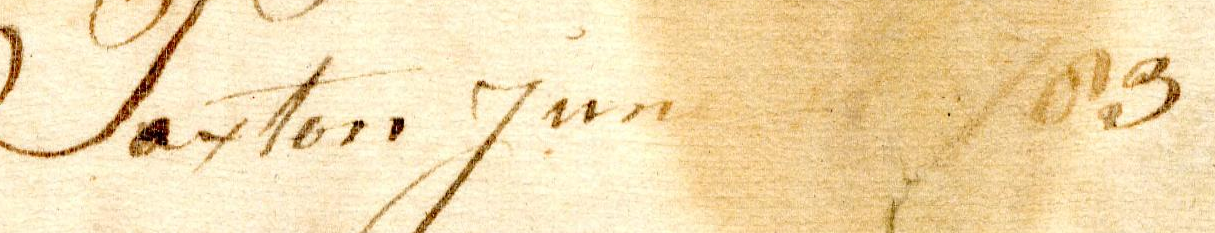Paxton June 1783
